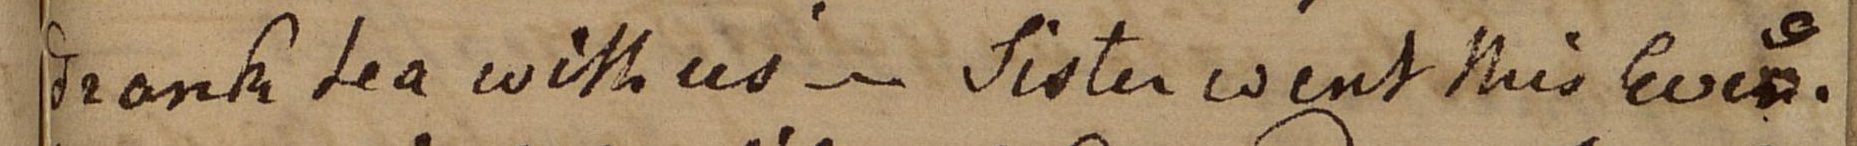drank tea with us- Sister went this Even.^g-
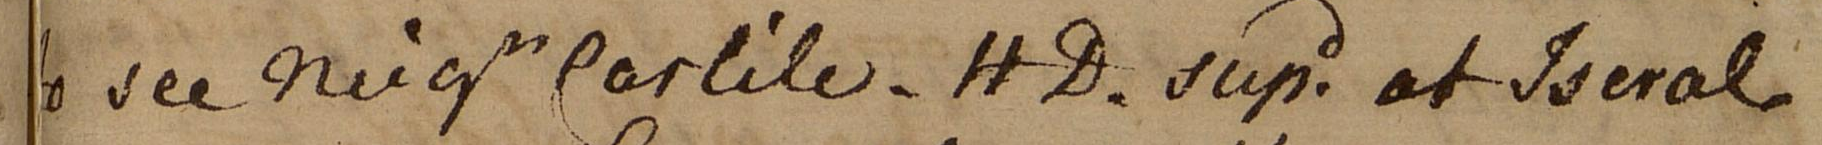to see Neig^r Carlile. H D. sup^d. at Iseral
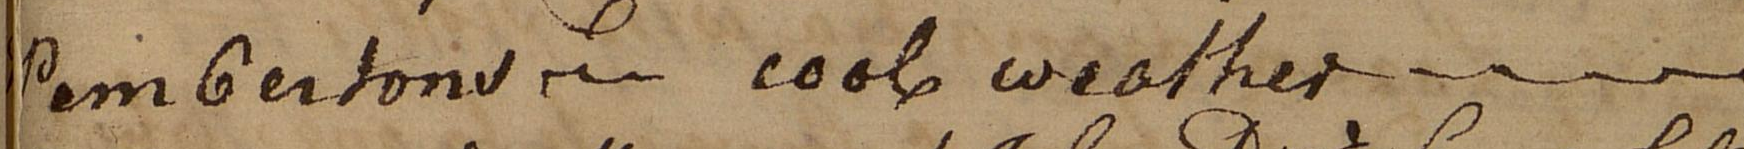Pembertons- cool weather-
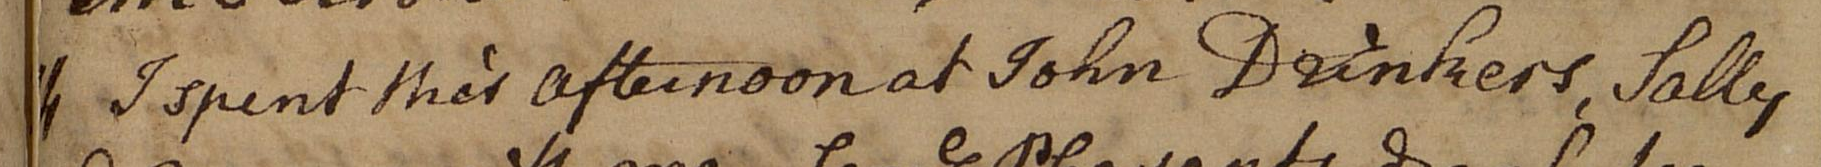[14] I spent this afternoon at John Drinkers, Sally
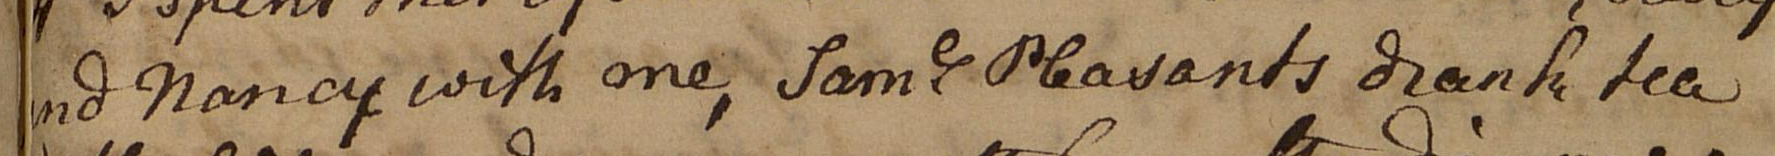and Nancy with one, Sam^l Pleasants drank tea
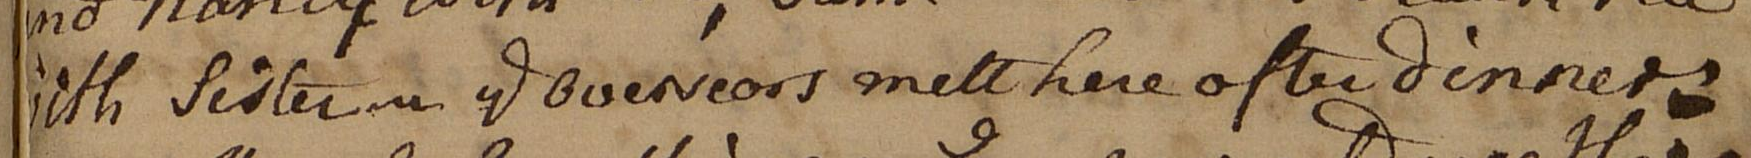[_]ith Sister- y^e oversears mett here after dinner-
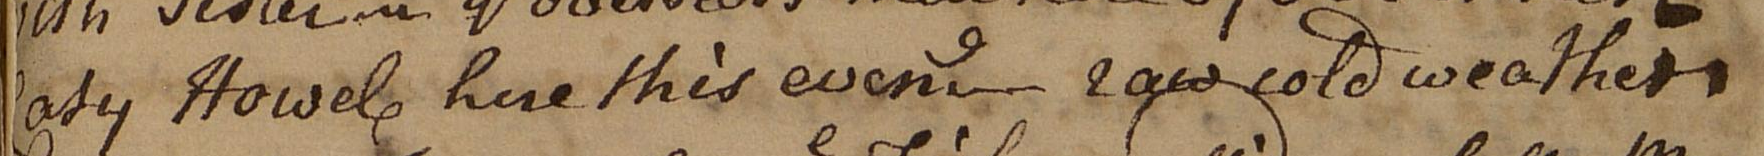caty Howel here this even^g- raw cold weather
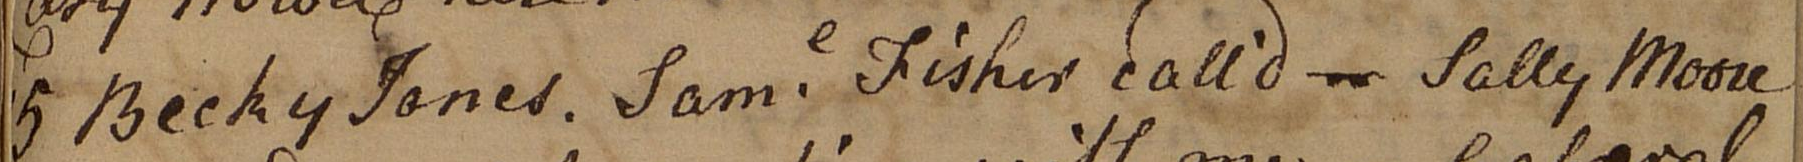15 Becky Jones, Sam^l Fisher call'd- Sally Moore
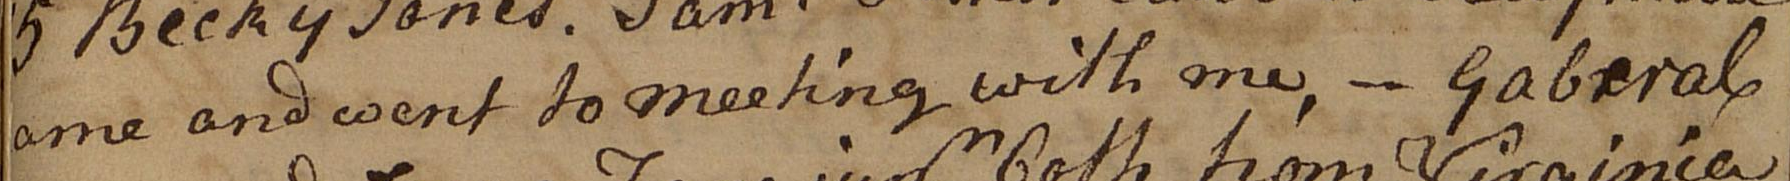ame and went to meeting with me.- Gaberal
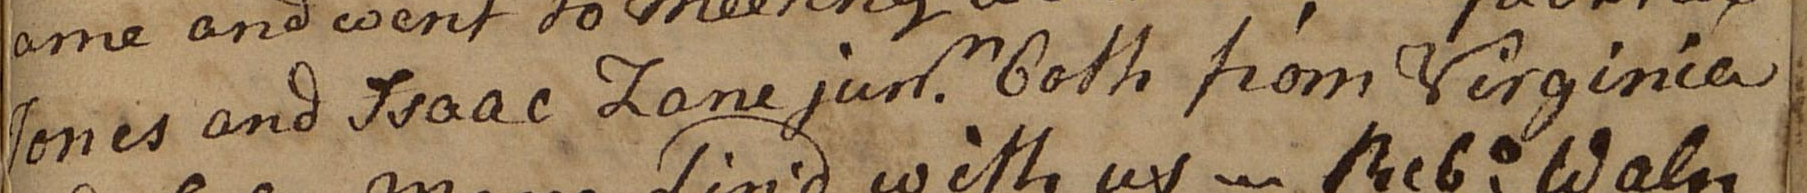Jones and Isaac Zane jun^r. both from Virginia
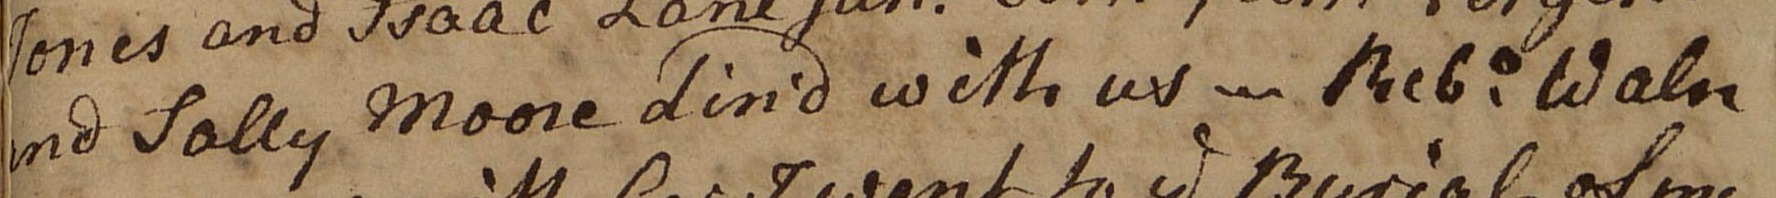and Sally Moore din'd with us- Reb^a. Waln
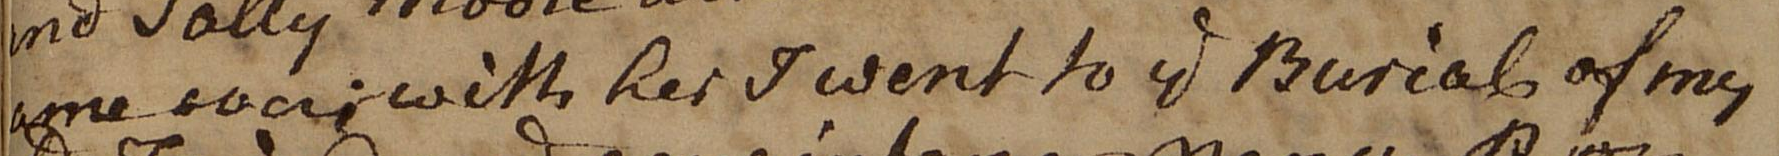ame over; with her I went to y^e Burial of my
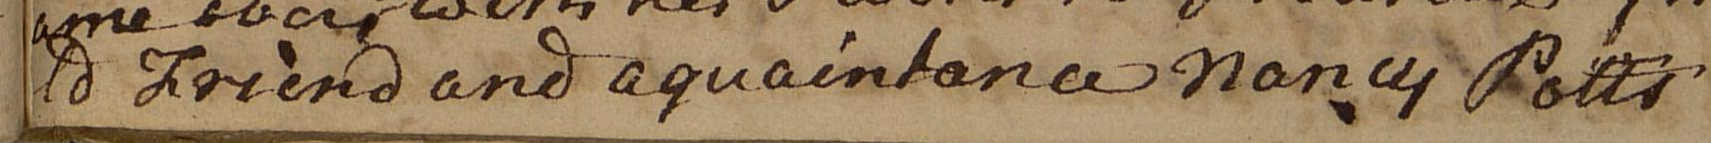ld Friend and aquaintance Nancy Potts
